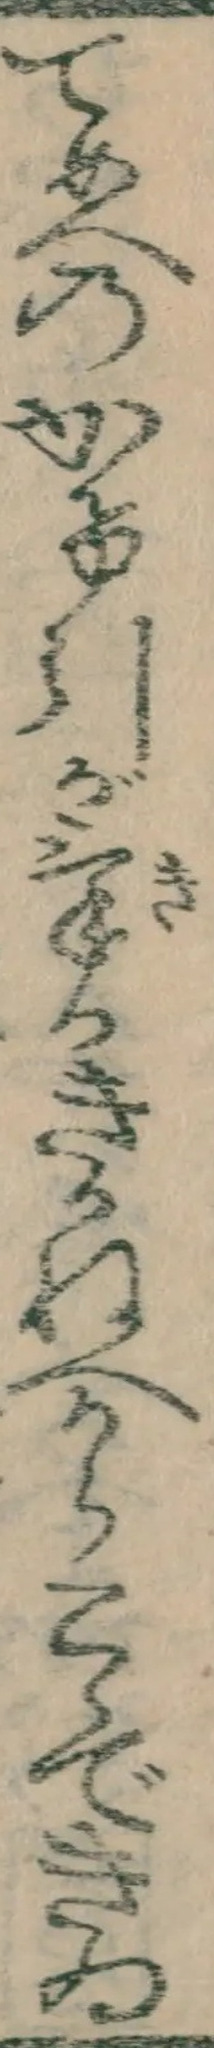てめへのかけ引が気かきかねへからこゝできゐ
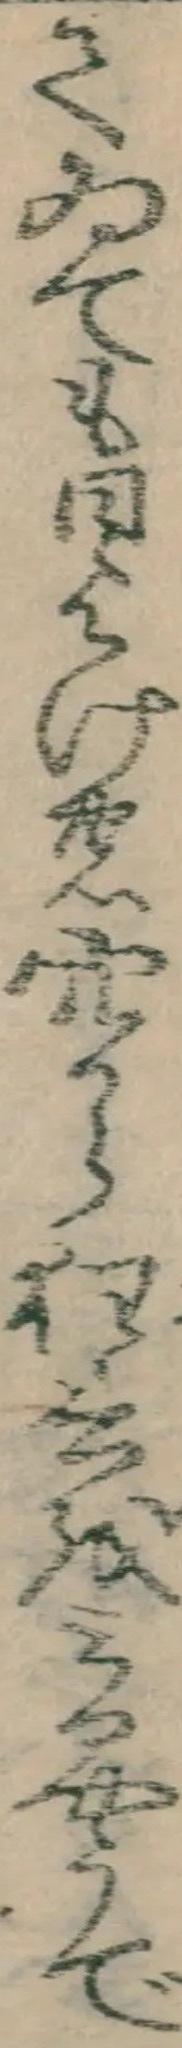てゐても日よけの穴から狂言をみるやうで
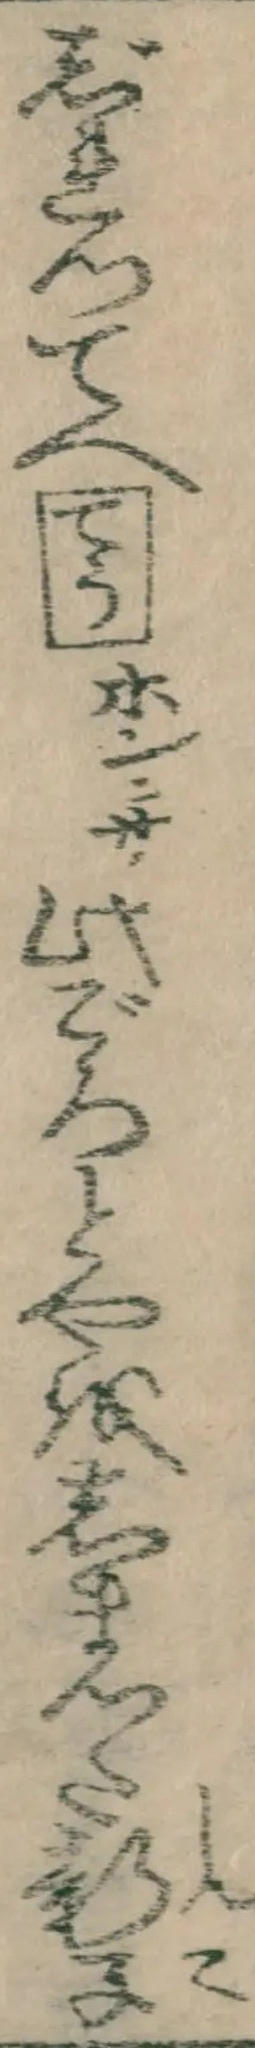じれつてへ〈てう〉ホンニサ此ごろとやをしまつた新子
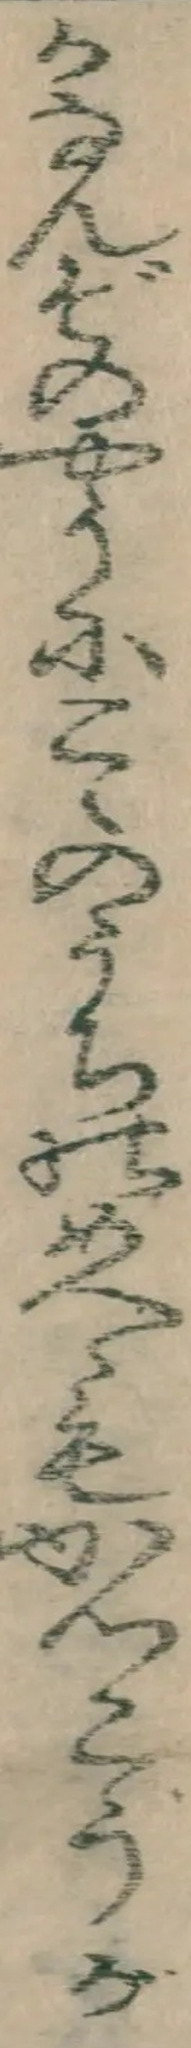かなんぞのやうにこゝのうちのめへゝもかつこうが

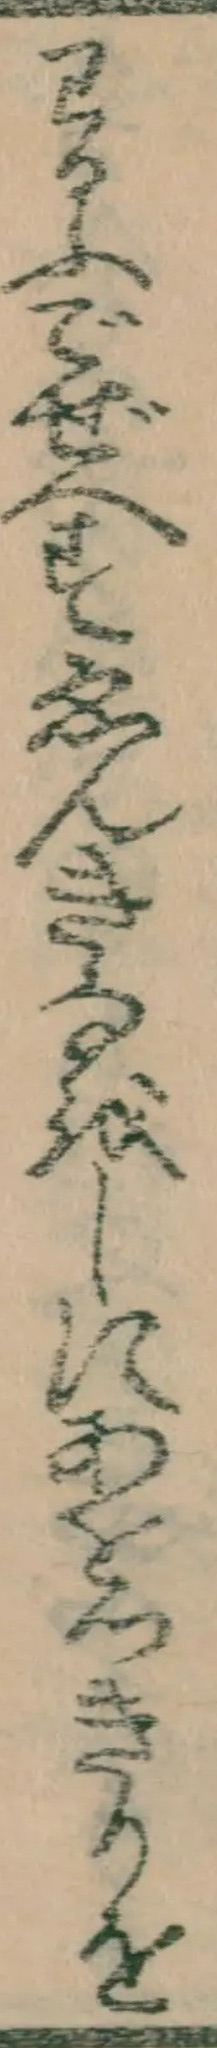わるふごぜへすゑんきなをしにあをつきりを
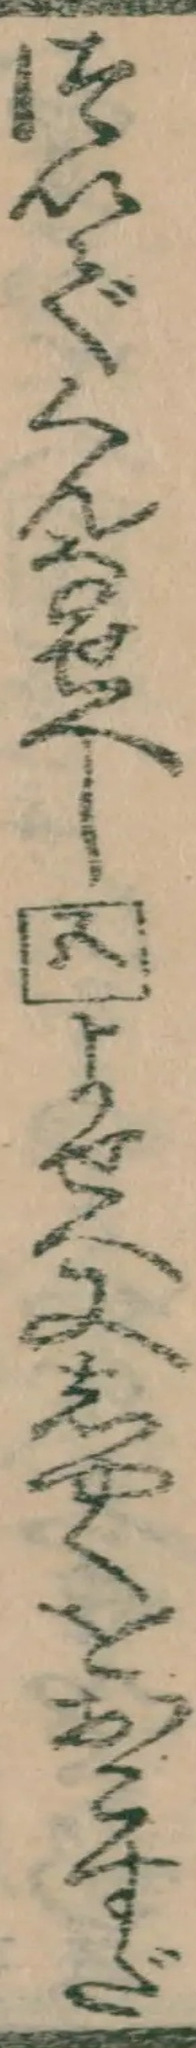ついでくんなせへし〈五〉よせへ又しやくをおこすだ
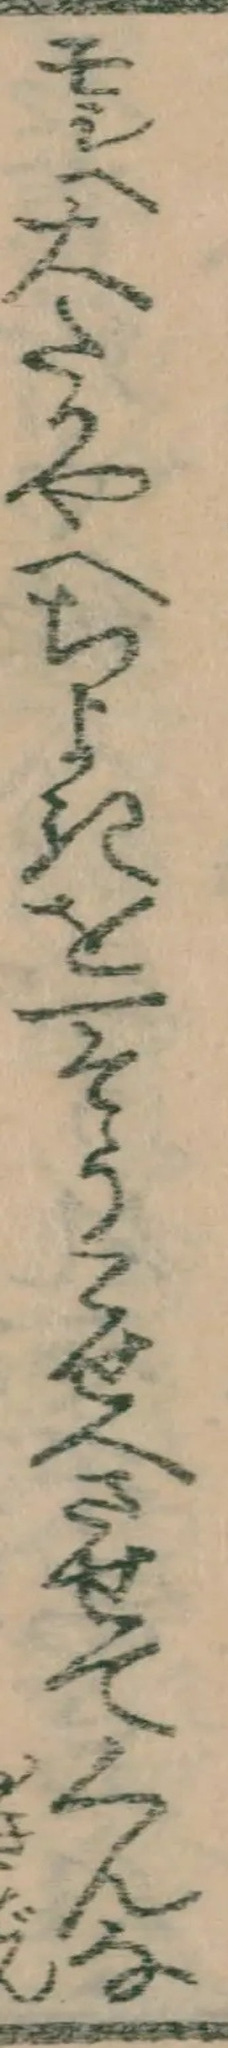モシヘ大たかやへちよきを一そうこせへさせてくんな
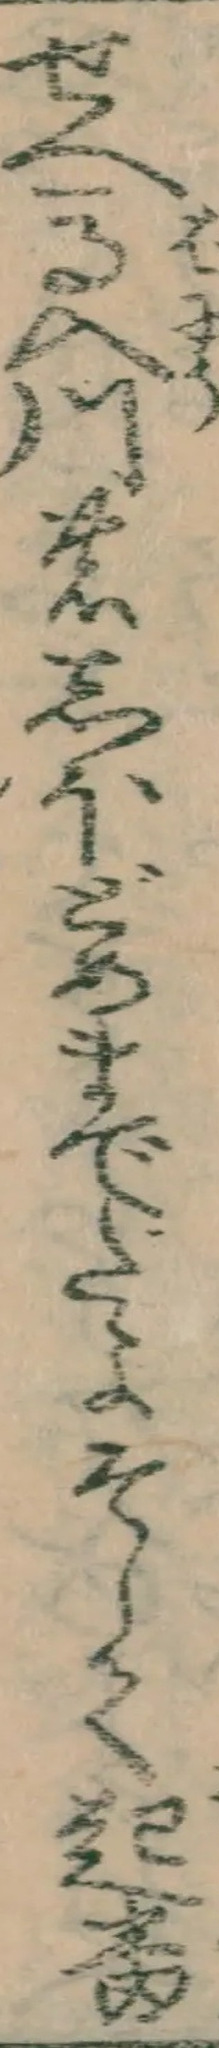せへ馬入川のしほどめまでだよそして起番
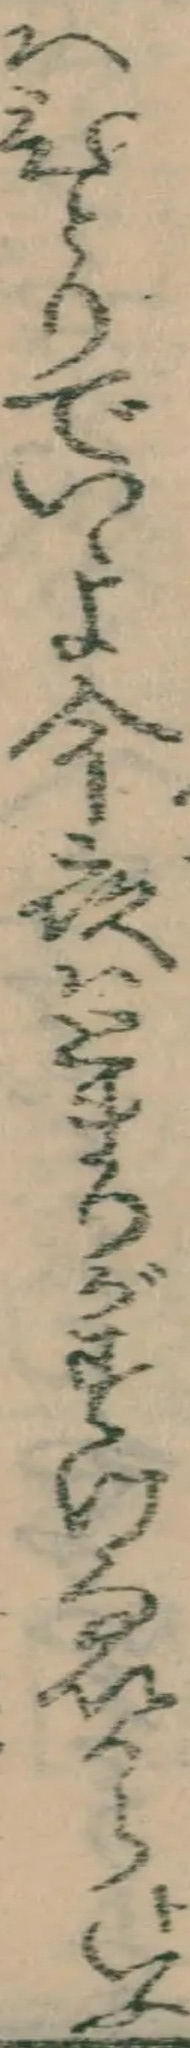はひとりでいゝよ今夜はとまりがすけないからトいふ
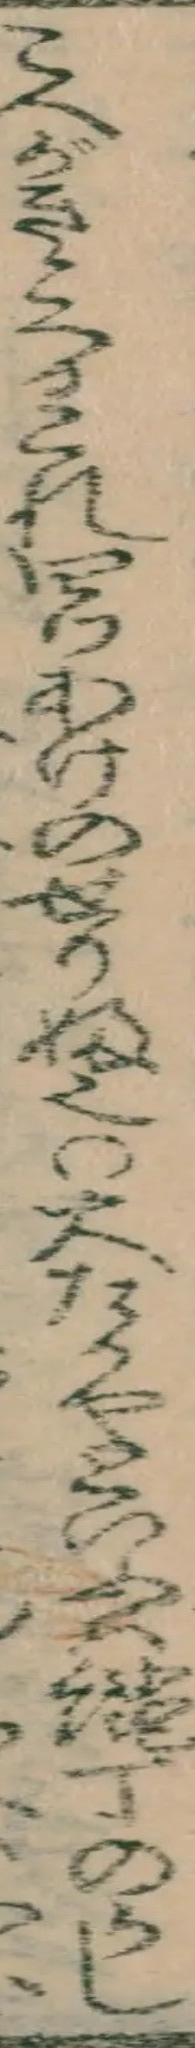こへがきこへるこれ四ツあけのせりふ也○大たかやといふは縄丁のかし
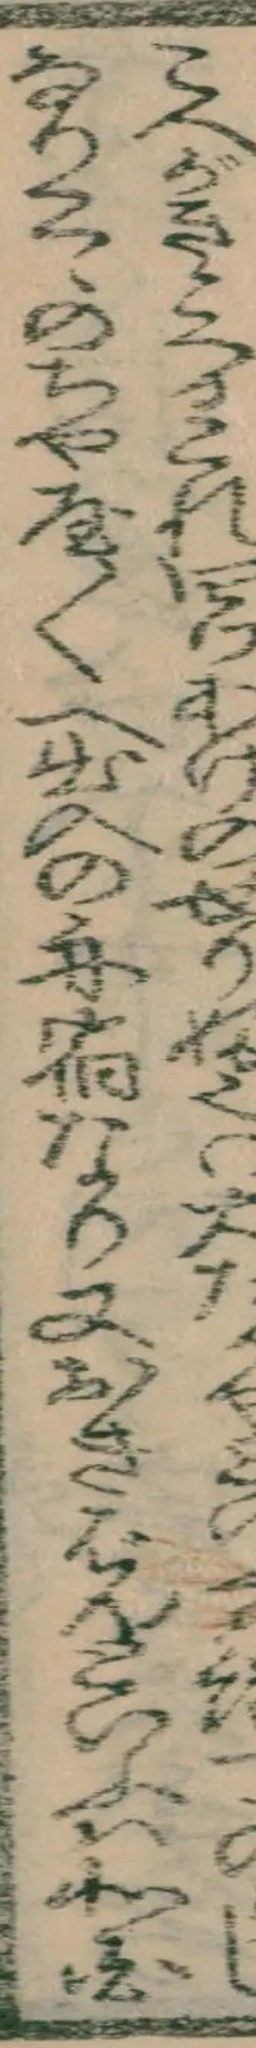なりこゝのちや屋〳〵へ出入の舟宿なり又おきばんといふは北国
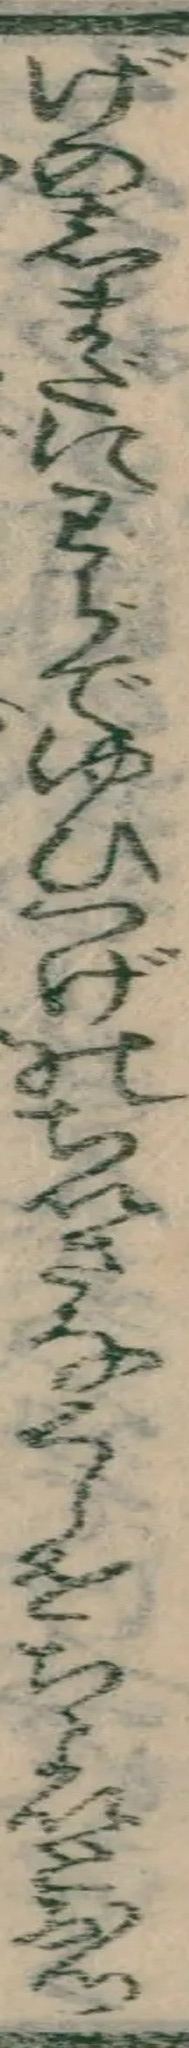げのしまだにわらでゆひつげのちいさなくしをちよいとおつ
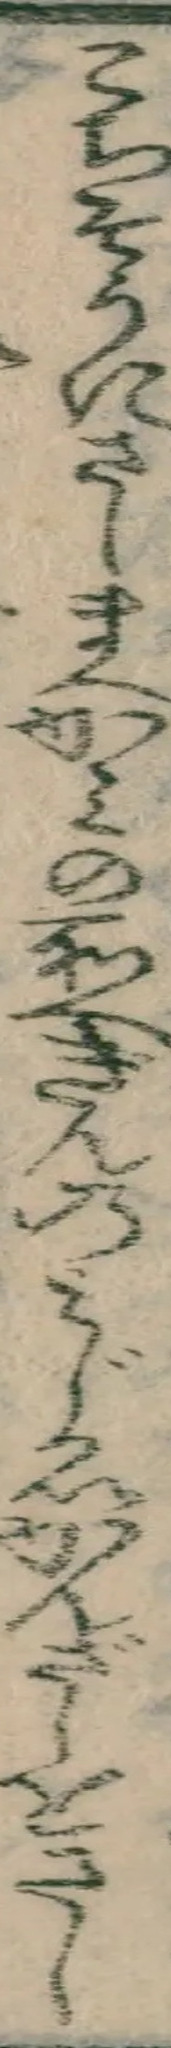こちそうにさしまへかみの所へぎんのみじかいかんざしをさし
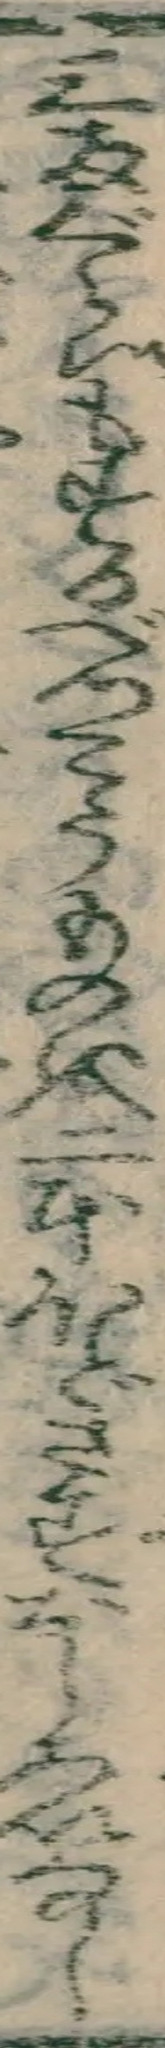三両ぐらいもするべつこうものを二本ほどさすおしろいなし
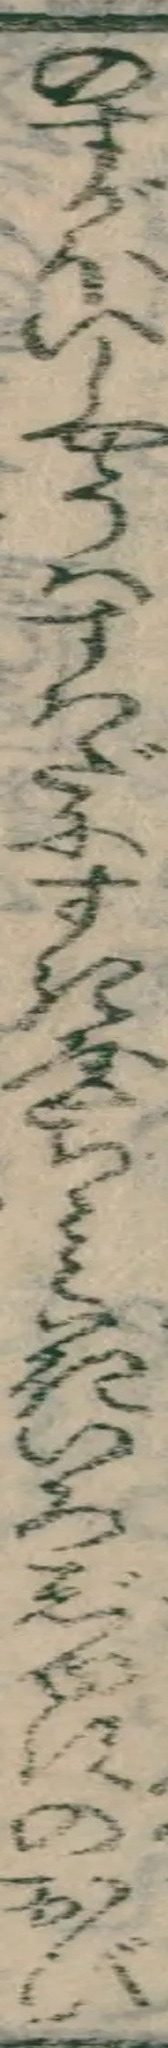のすがほいしやうはすはだにすき屋ちゝみ花いろじゆすのおび
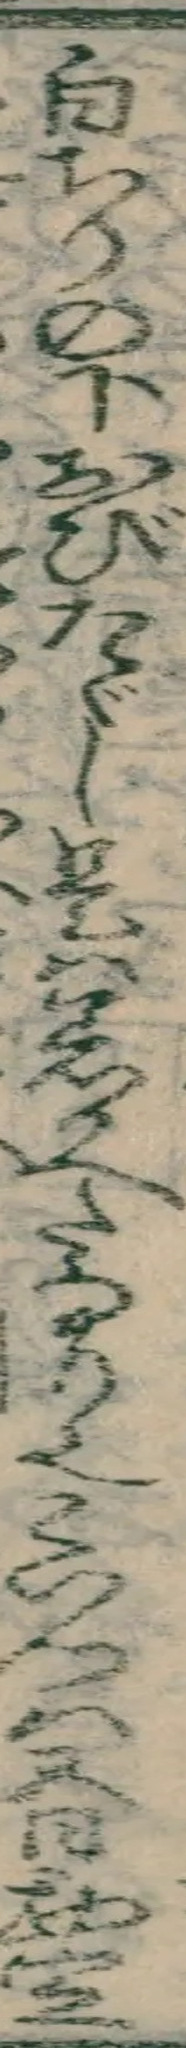白ちりの下おびたゞし是は着かへたなり也こいつは五日勘定
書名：教訓読本：大礒風俗仕懸文庫
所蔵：国立国会図書館 National Diet Library, JAPAN
